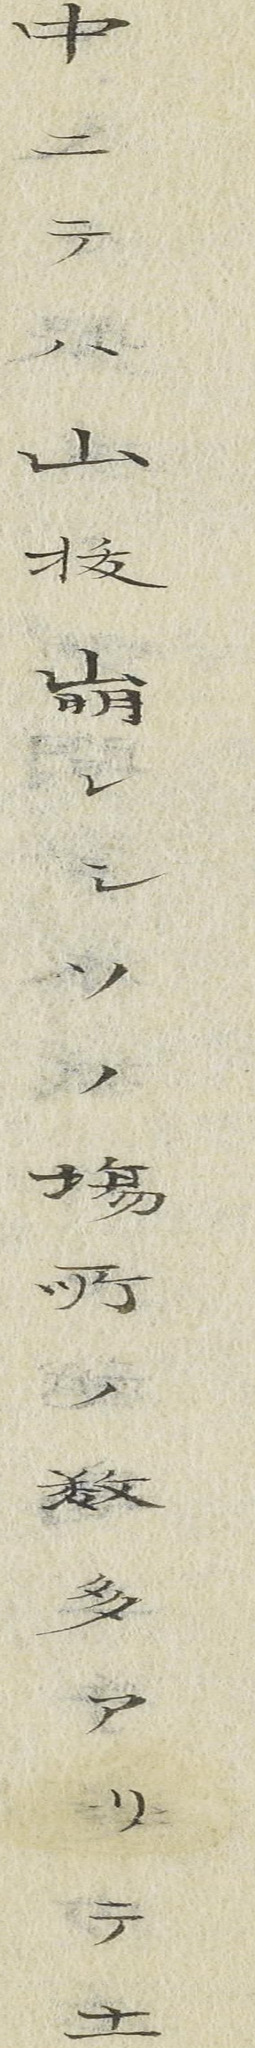中ニテハ山抜崩レシソノ場所ノ数多アリテ土
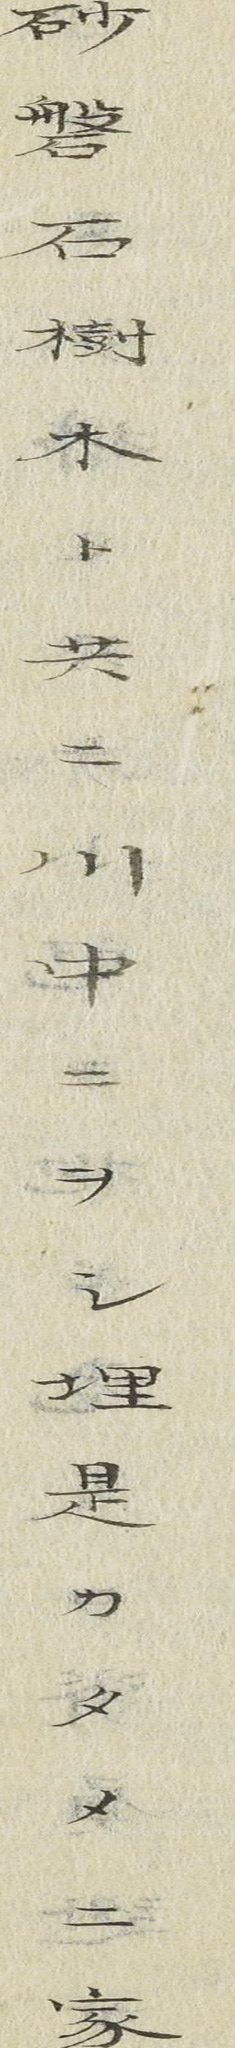砂盤石樹木ト共ニ川中ニヲシ埋是カタメニ家
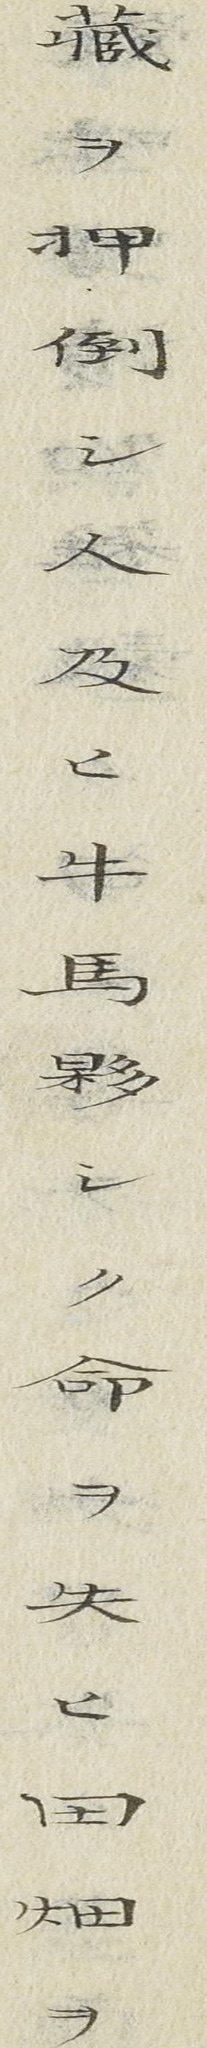蔵ヲ押倒シ人及ヒ牛馬夥シク命ヲ失ヒ田畑ヲ
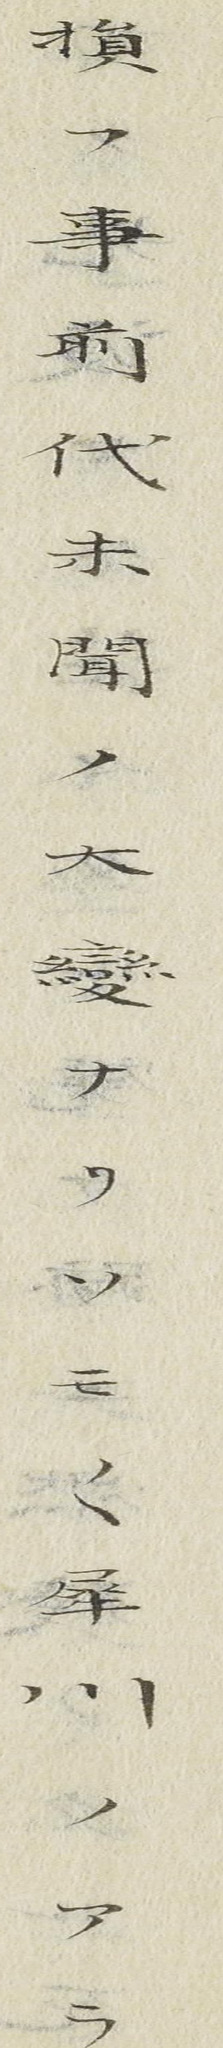損フ事前代未聞ノ大変ナリソモ〱犀川ノアラ
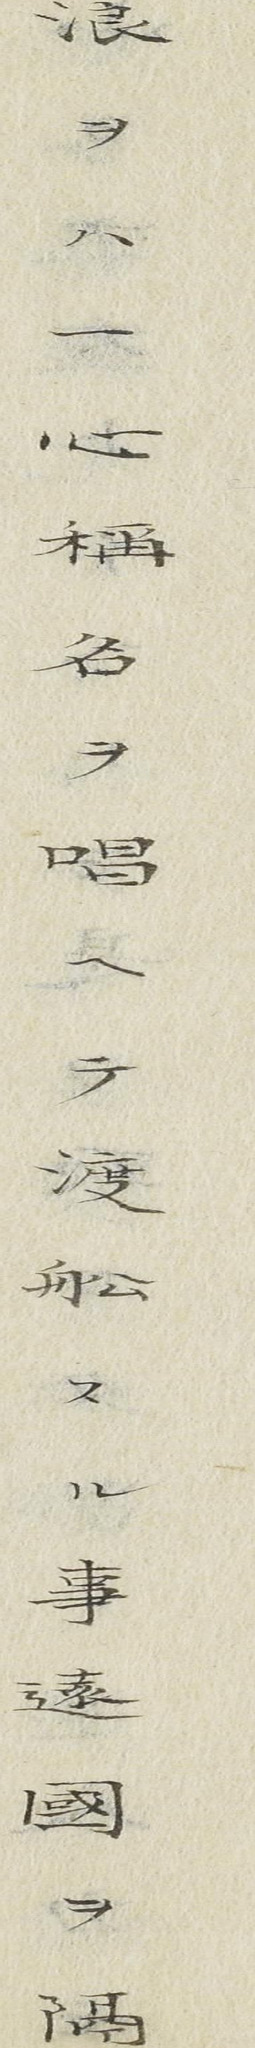浪ヲハ一心称名ヲ唱ヘテ渡船スル事遠国ヲ隔
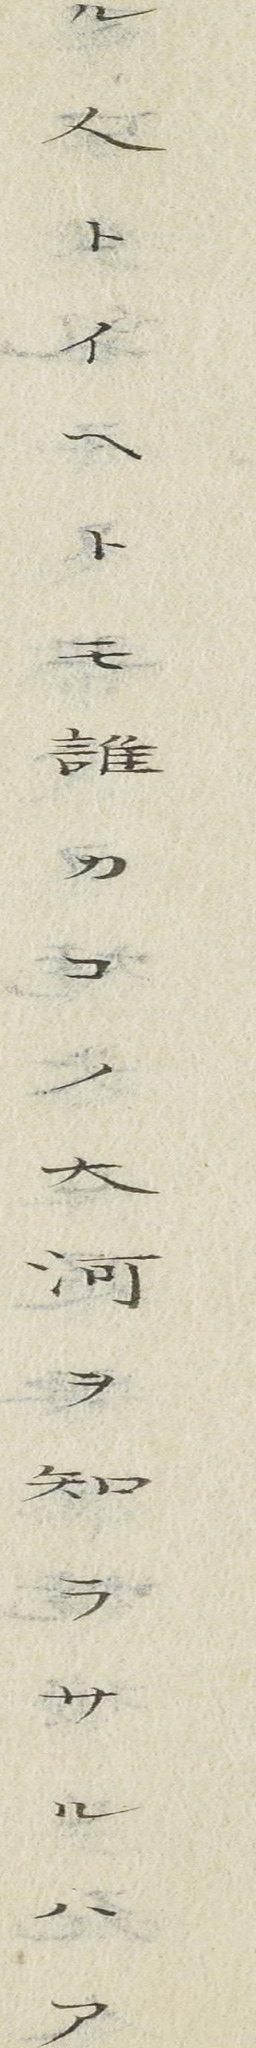ル人トイヘトモ誰カコノ大河ヲ知ラサルハア
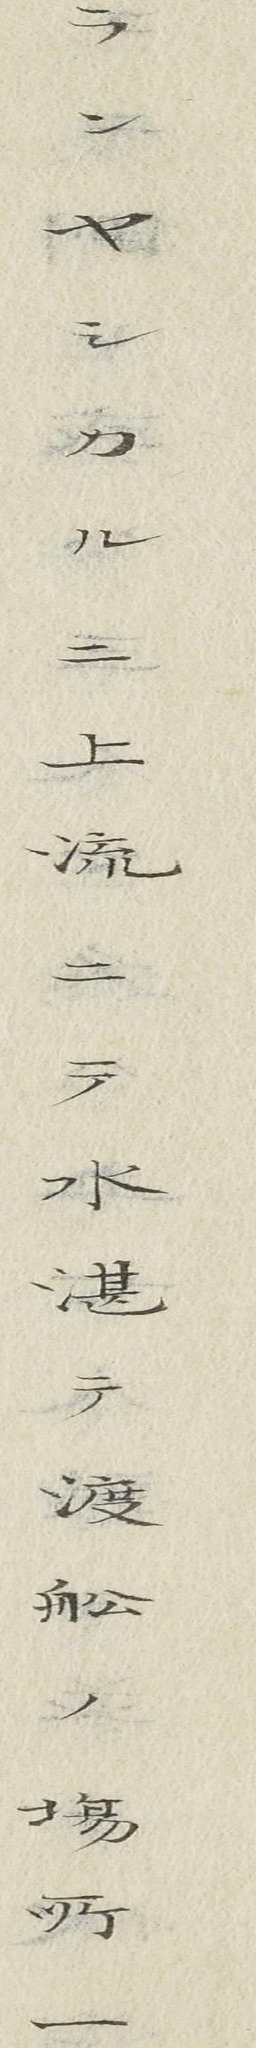ランヤシカルニ上流ニテ水湛ヲ渡船ノ場所一
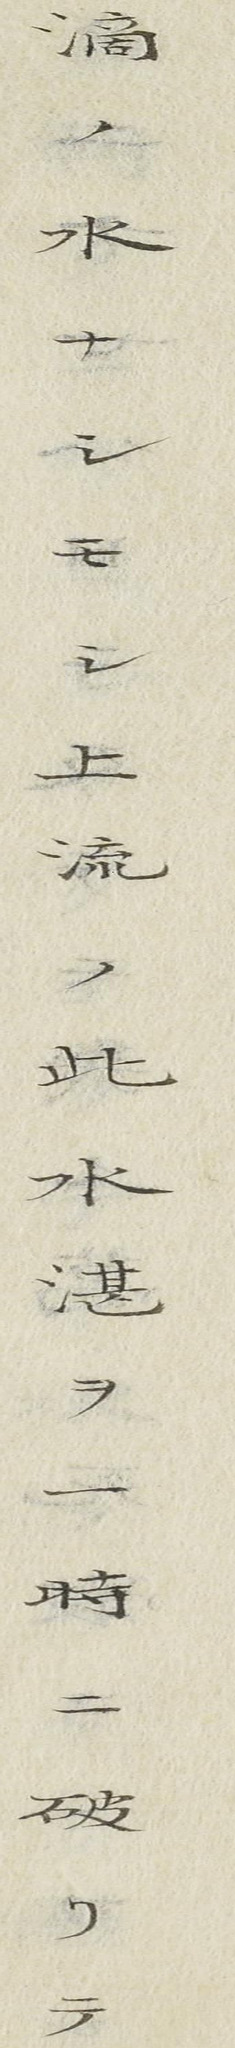滴ノ水ナシモシ上流ノ此水湛ヲ一時ニ破リテ
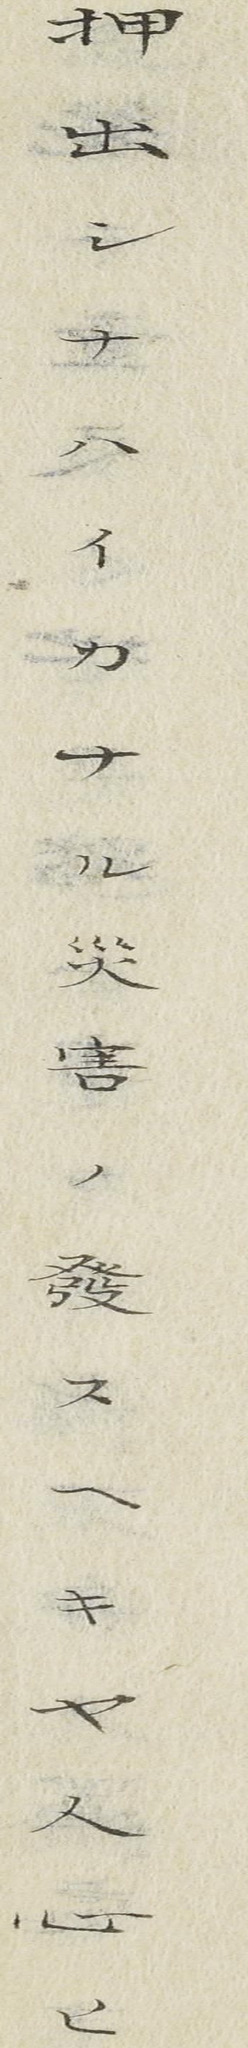押出シナハイカナル災害ノ発スヘキヤ人心ヒ
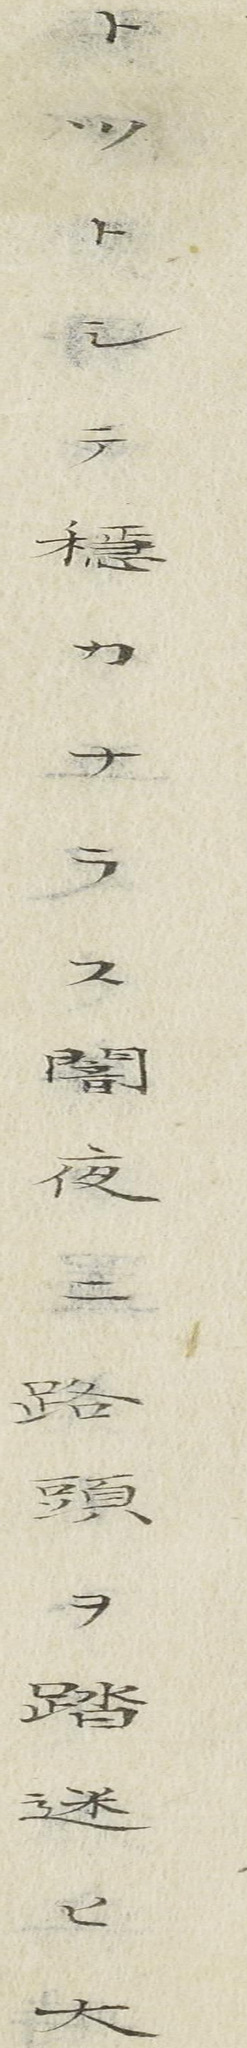トツトシテ穏カナラス暗夜ニ路頭ヲ踏迷ヒ大
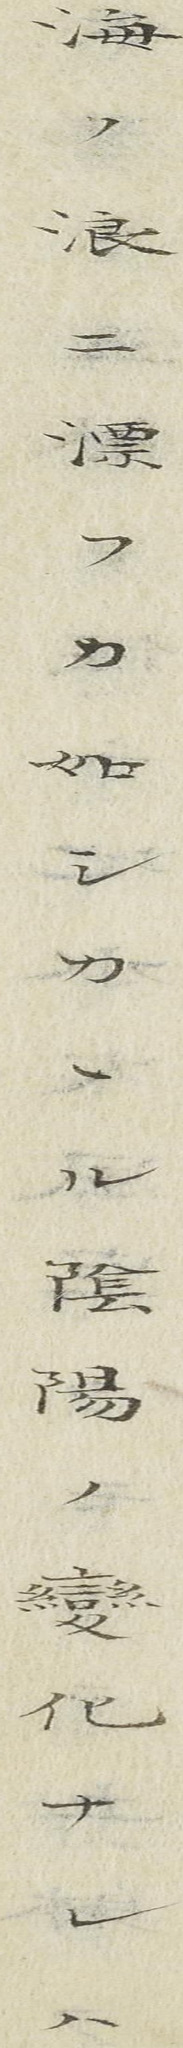海ノ浪ニ漂フカ如シカヽル陰陽ノ変化ナレハ
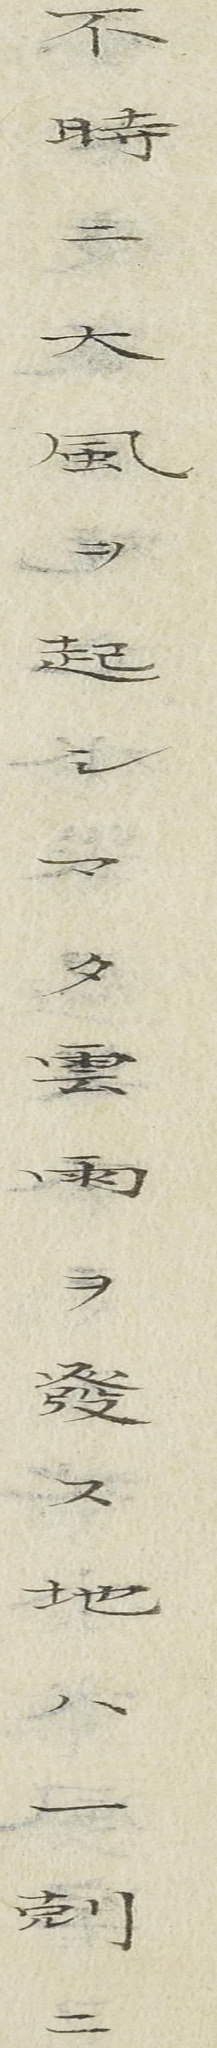不時ニ大風ヲ起シマタ曇雨ヲ発ス地ハ一刻ニ

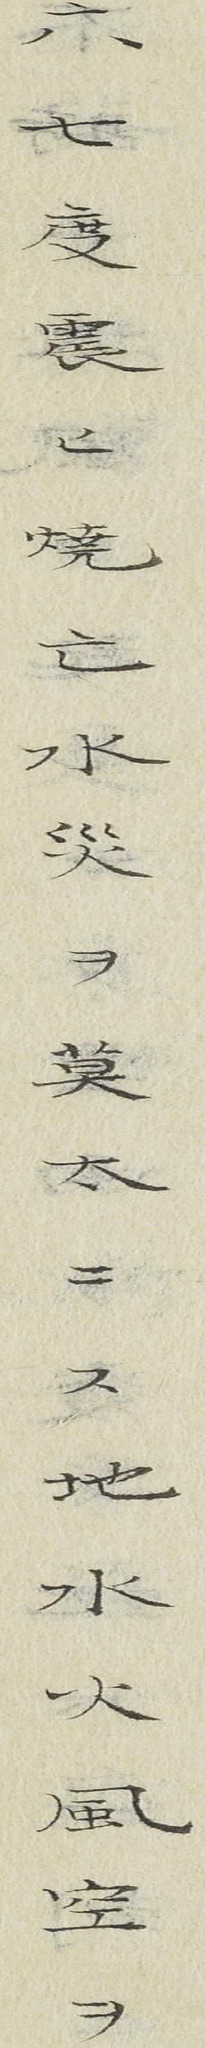六七度震ヒ焼亡水災ヲ莫太ニス地水火風空ヲ
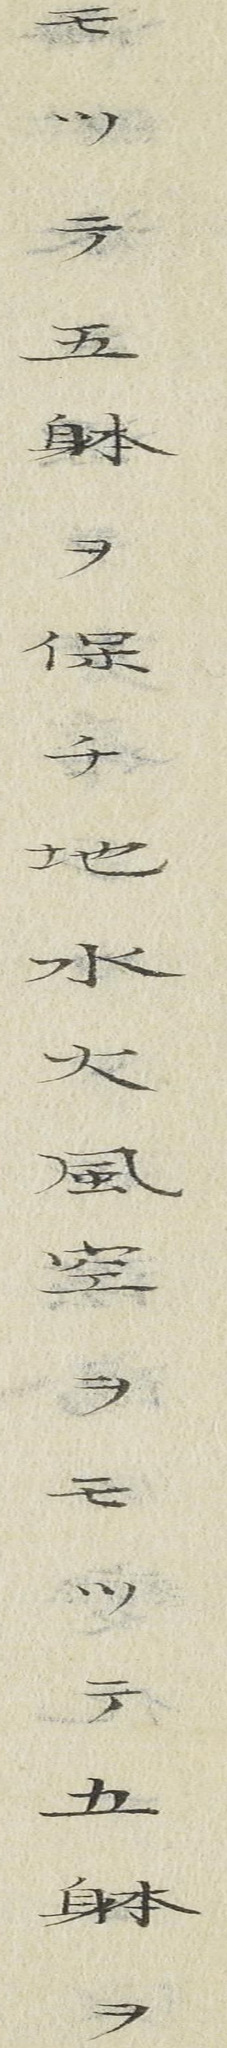モツテ五体ヲ保チ地水火風空ヲモツテ五体ヲ
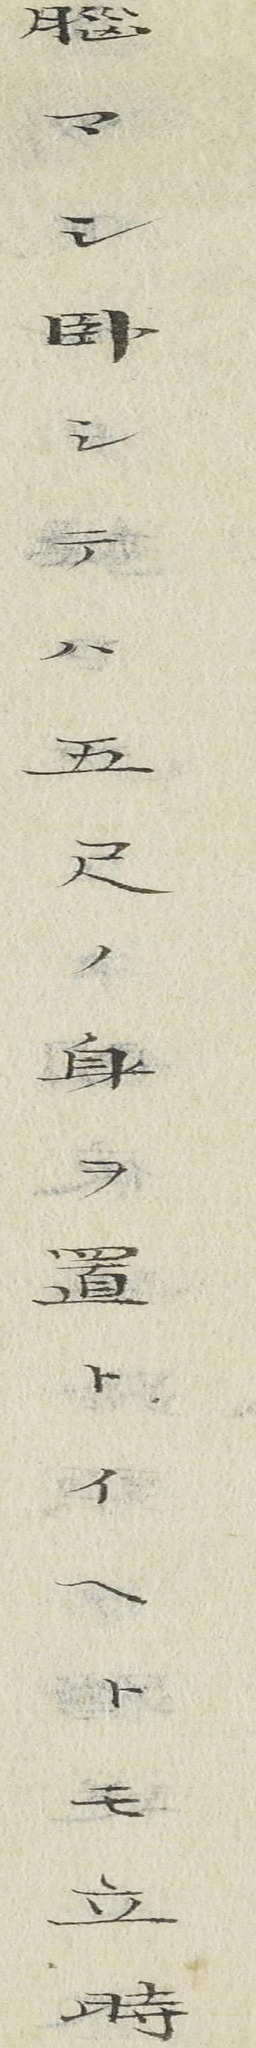脳マシ卧シテハ五尺ノ身ヲ置トイヘトモ立時
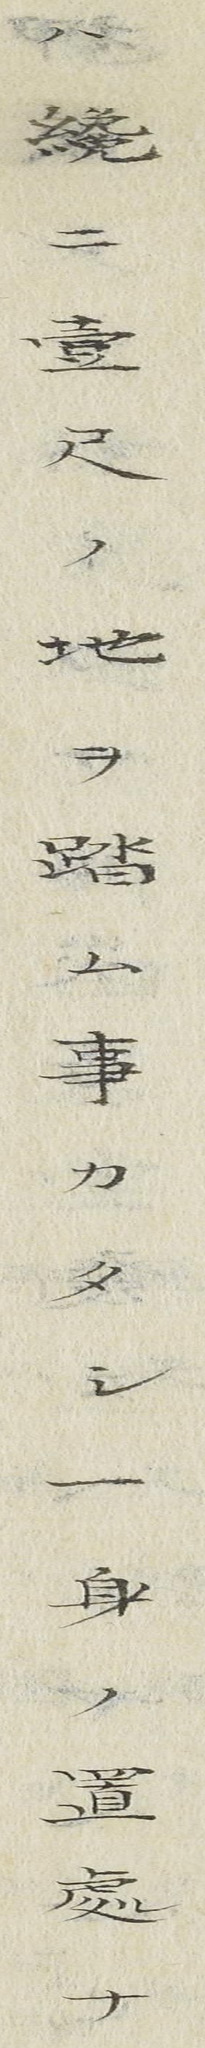ハ纔ニ壹尺ノ地ヲ踏ム事カタシ一身ノ置処ナ
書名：地災撮要　地震之部　巻ノ二
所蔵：東京大学地震研究所図書室 Earthquake Research Institute Library, The University of Tokyo, JAPAN
